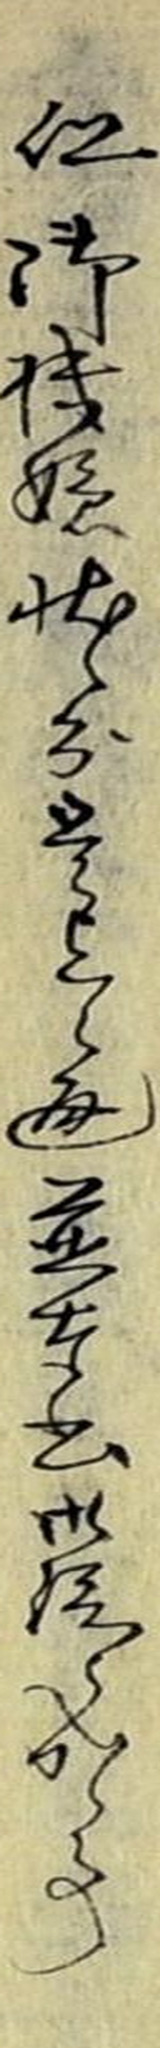但御機嫌状之分是迄之通並奉書御渡被成候事
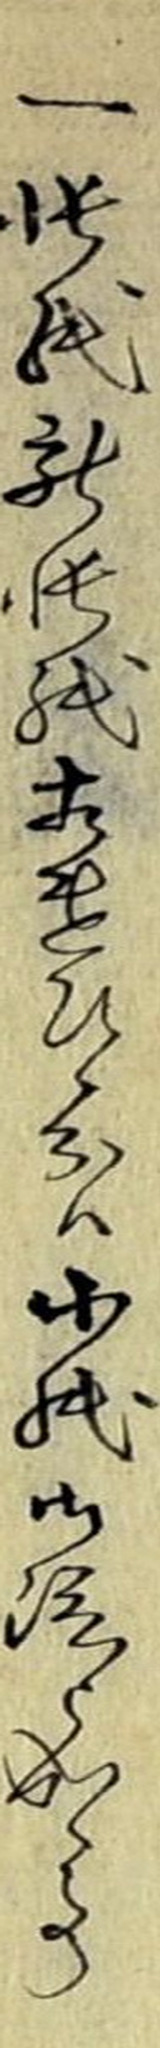一帳紙新帳紙相遣ひ候分は小紙御渡被成候事
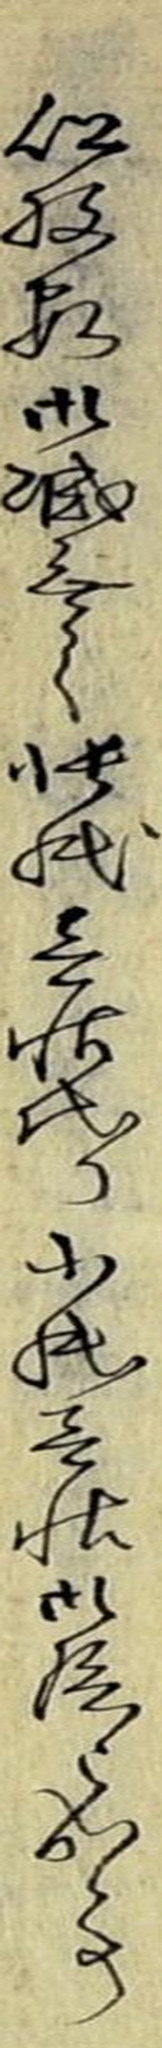但枚数御減無之帳紙壱帳代り小紙壱帖御渡被成候事
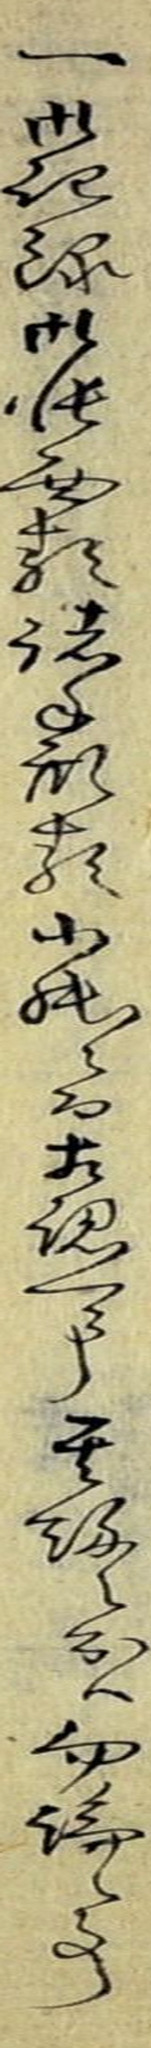一御記録御帳面類諸手形類小紙に而相認可申其餘之分は勿論之事
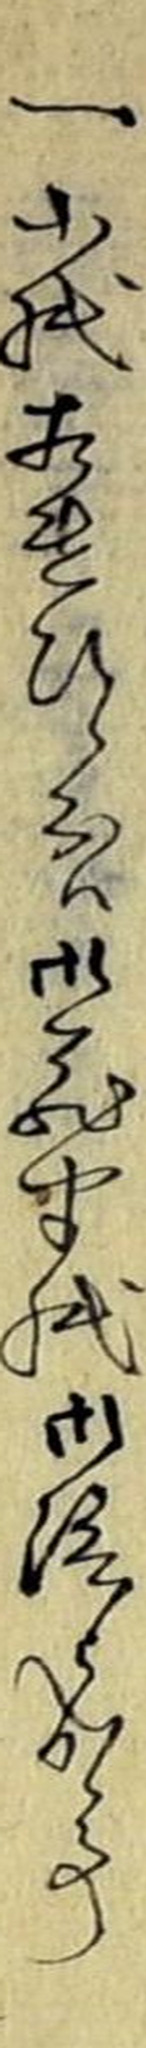一小紙相遣ひ候分は御蔵半紙御渡被成候事
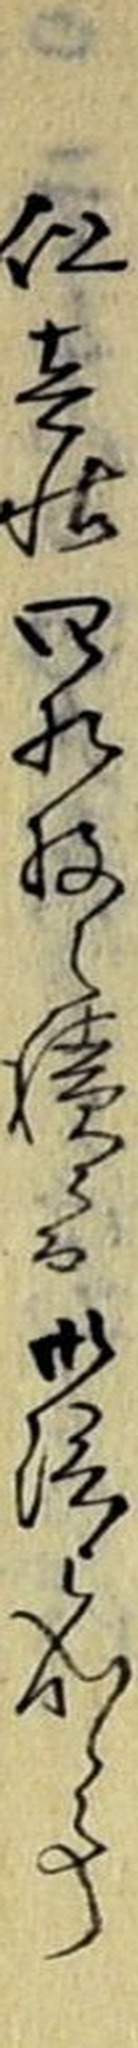但壱帖四拾枚之積に而御渡被成候事
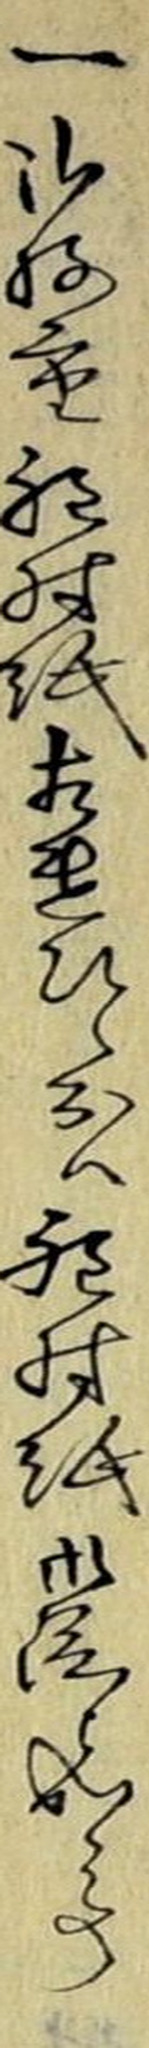一弐枚重程村紙相遣ひ候分は程村紙御渡被成候事
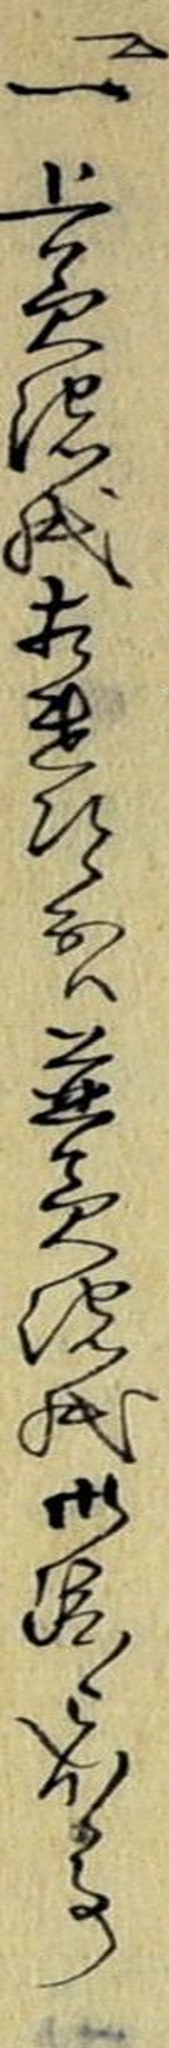一上美濃紙相遣ひ候分は並美濃紙御渡被成候事
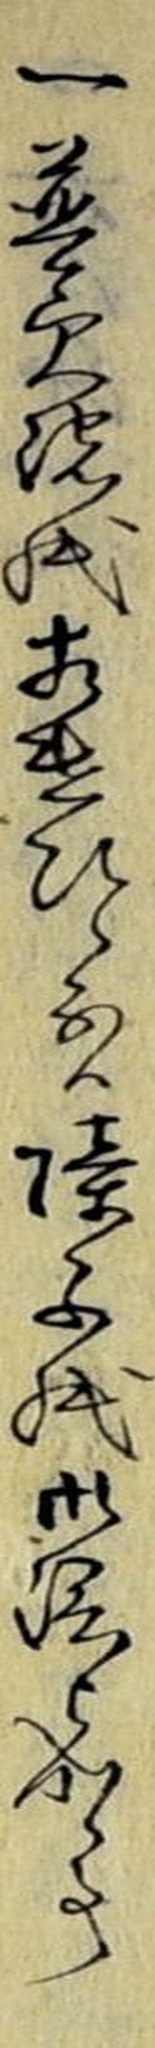一並美濃紙相遣ひ候分は障子紙御渡被成候事
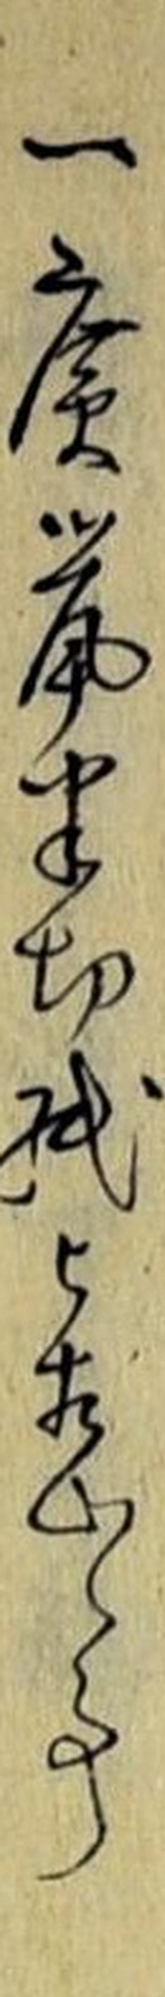一廣鼠半切紙被相止候事
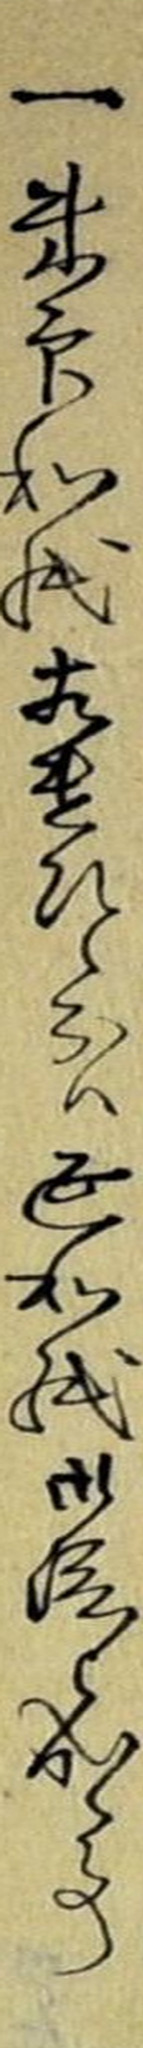一朱印和紙相遣ひ候分は延和紙御渡被成候事
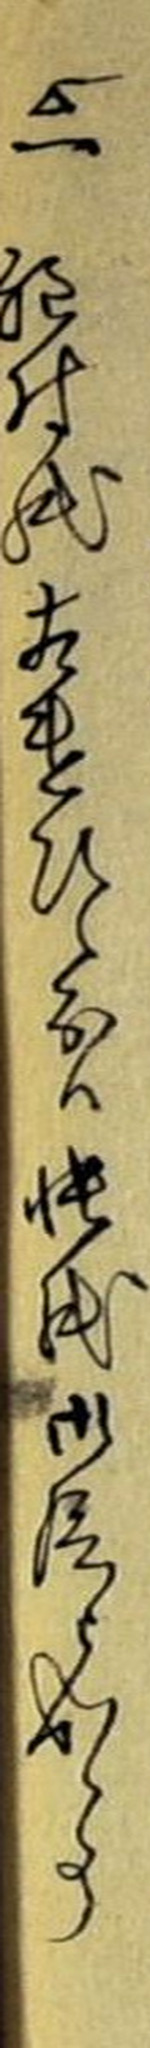△一程村紙相遣被候分は帳紙御渡被成候事
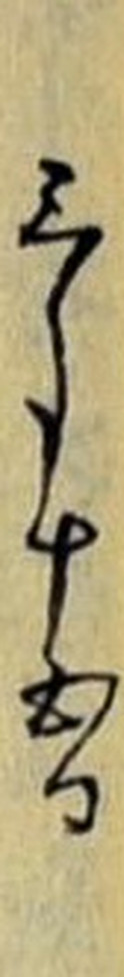三月十五日
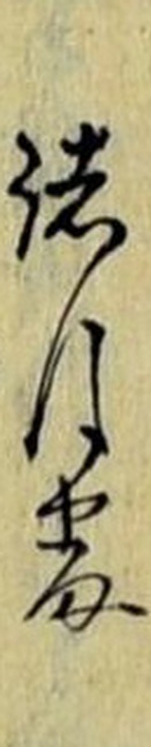諸月番
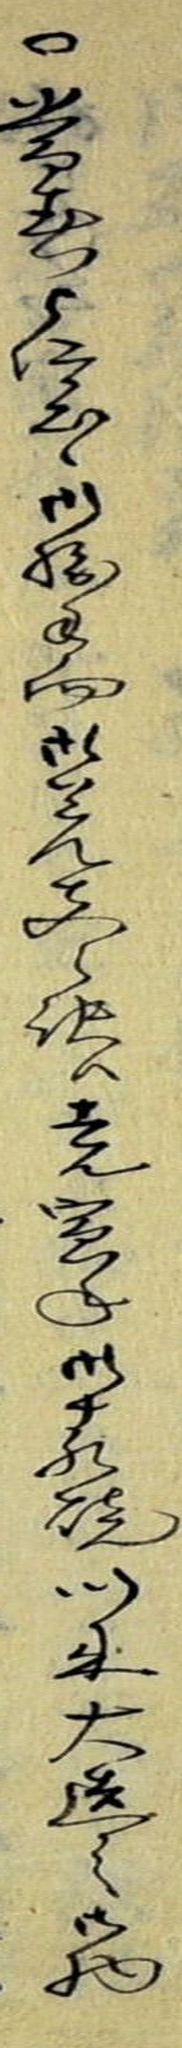○当春被仰出候御勝手向御差支之訳は去ル寅年御類焼以来大造之御物
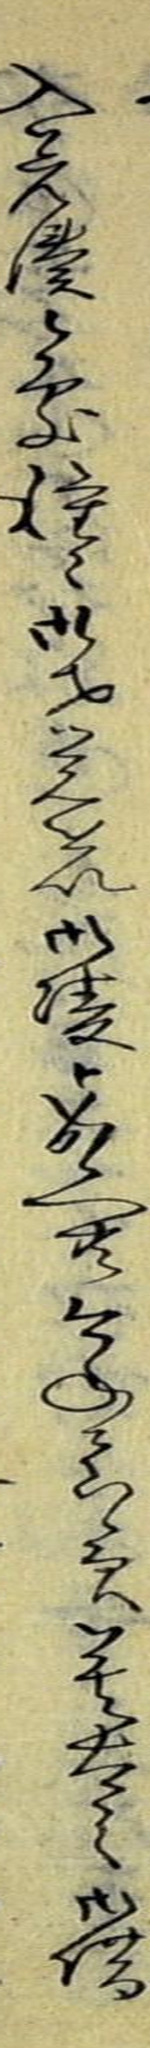入差湊候処種々御才覚を以御凌被成候へ共今年に至候而は莫大之御借
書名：命令之部 四
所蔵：福井県文書館 Fukui Prefectural Archives
